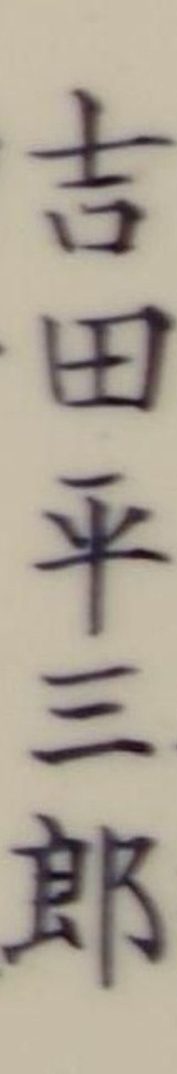吉田平三郎
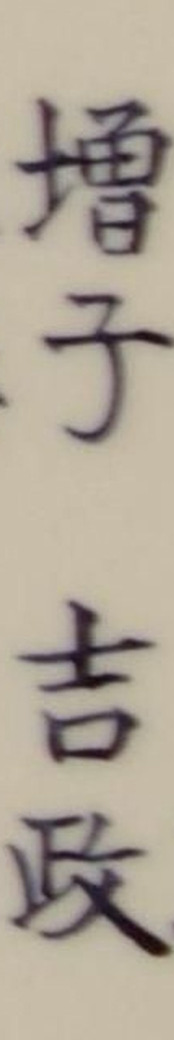増子吉政
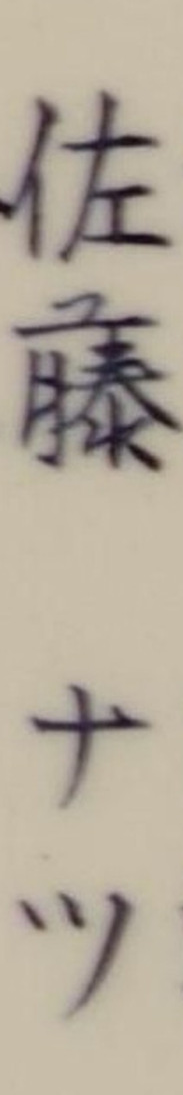佐藤ナツ
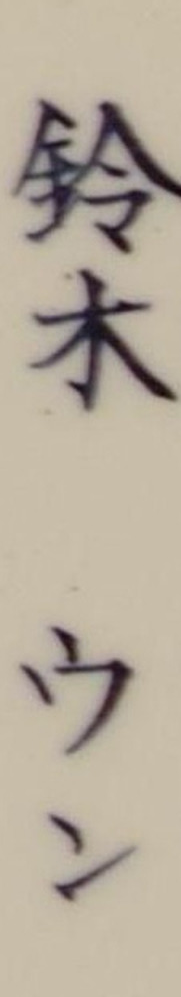鈴木ウン
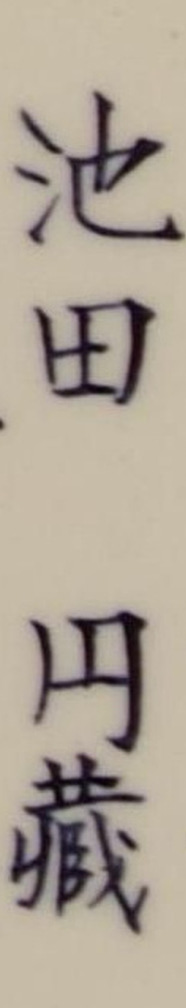池田円蔵
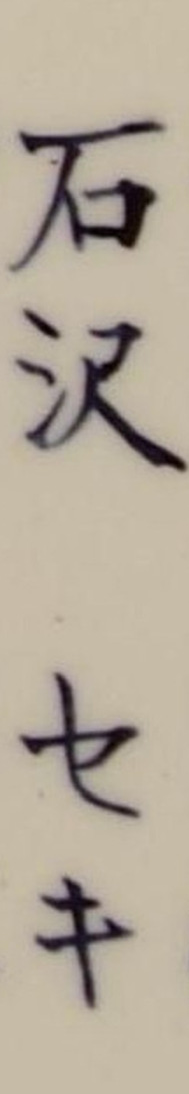石沢セキ
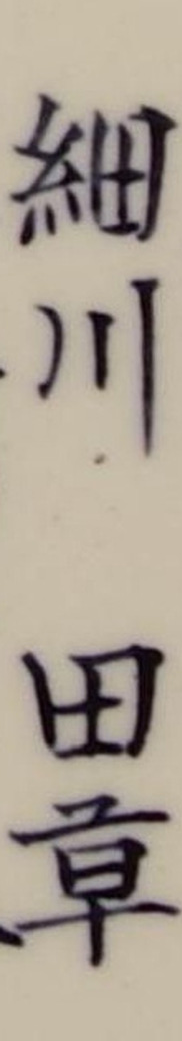細川田章
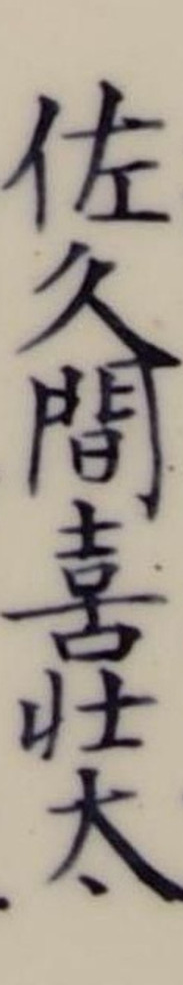佐久間喜壮太
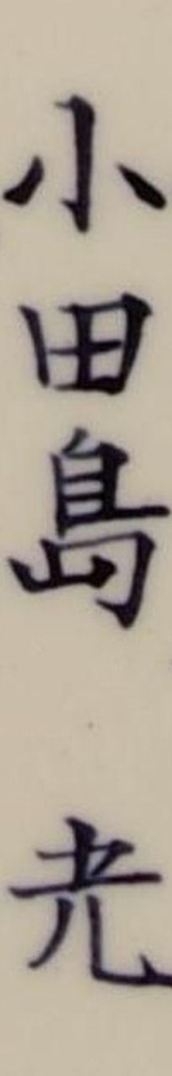小田島光
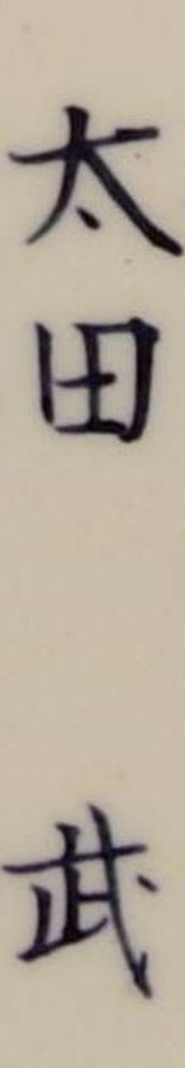太田武
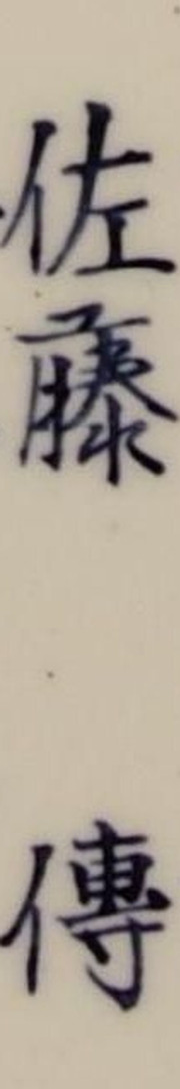佐藤傳
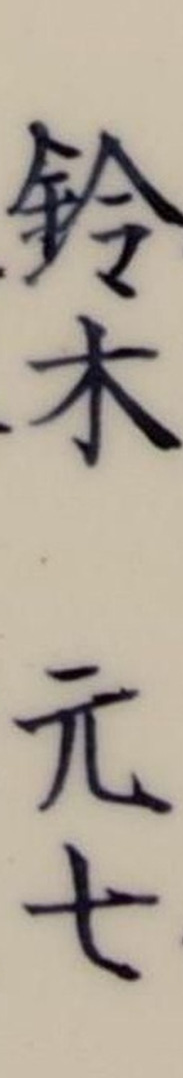鈴木元七
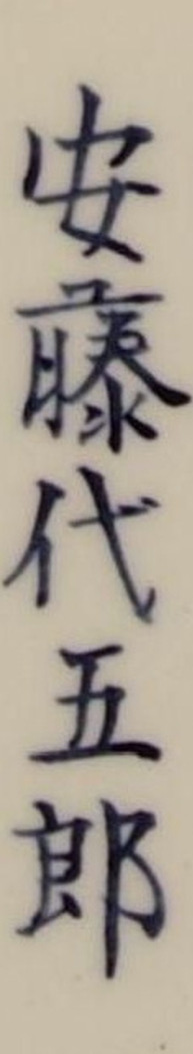安藤代五郎
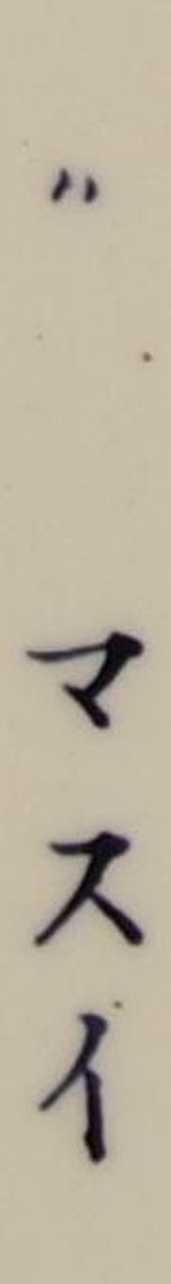マスイ
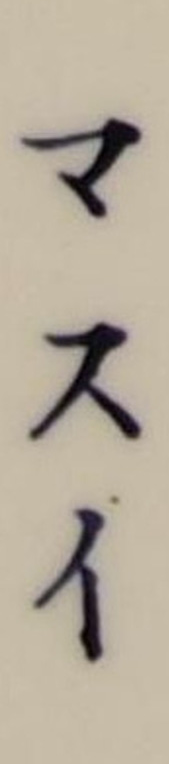マスイ
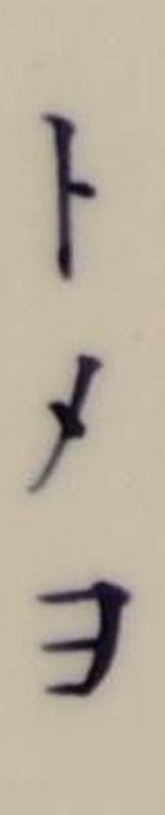トメヨ
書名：E~L
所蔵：高野山金剛峯寺
